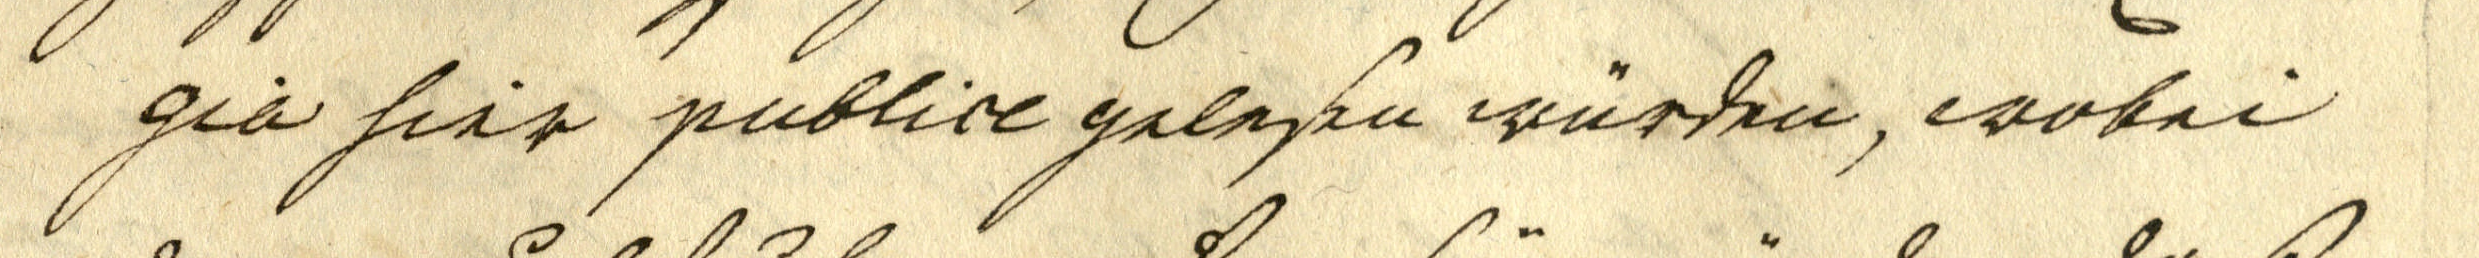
gien hier publice gelesen würden, wobei
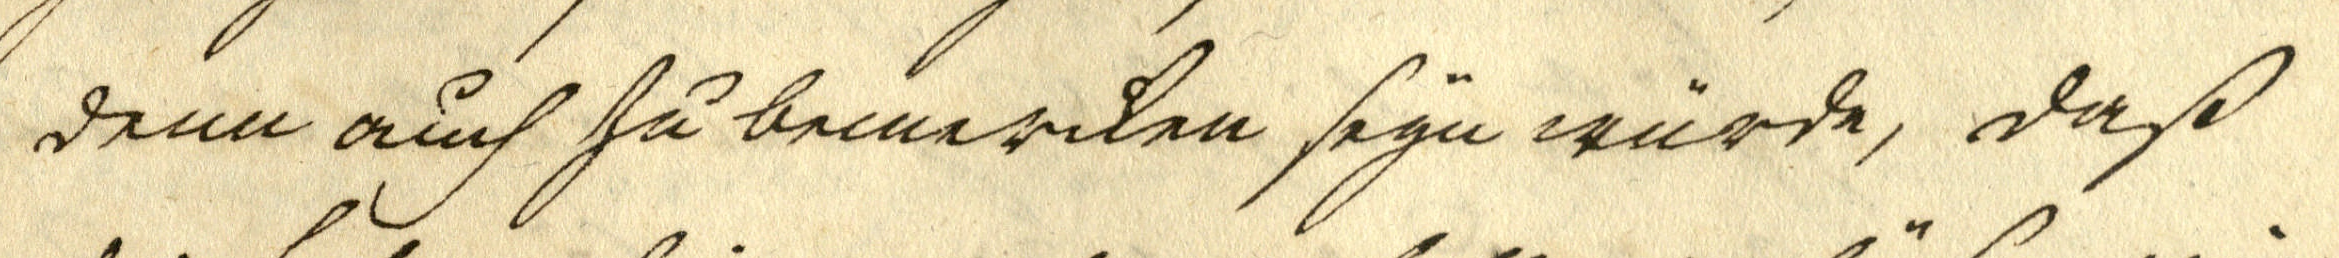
denn auch zu bemercken seyn würde, daß
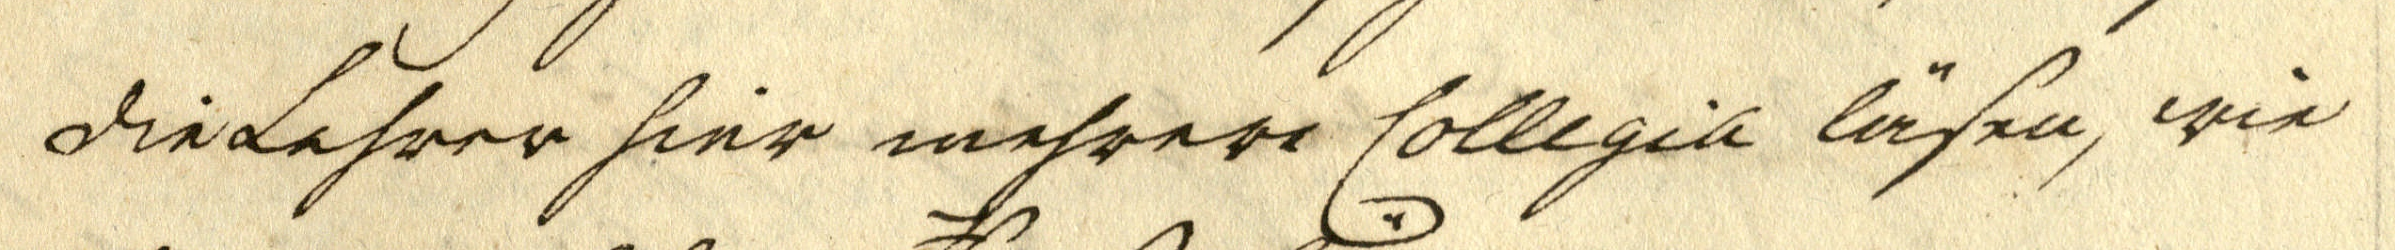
die Lehrer hier mehrere Collegii läsen, wie
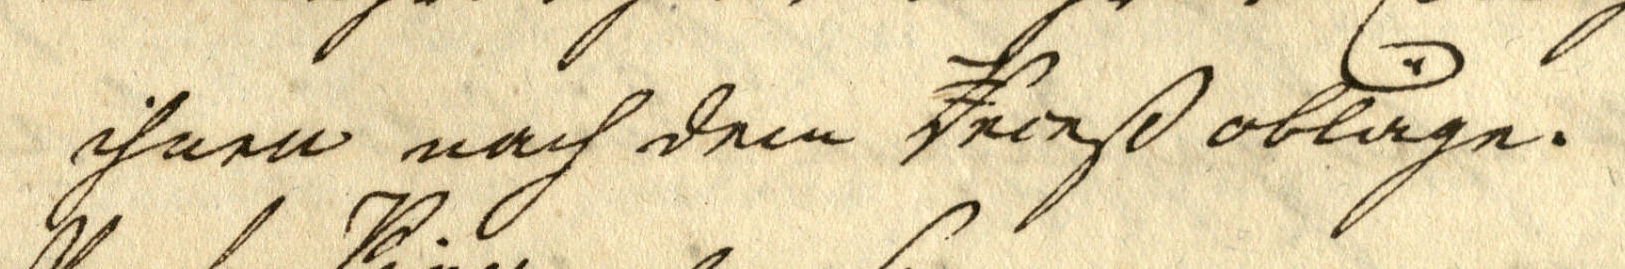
ihnen nach dem Receß obläge.
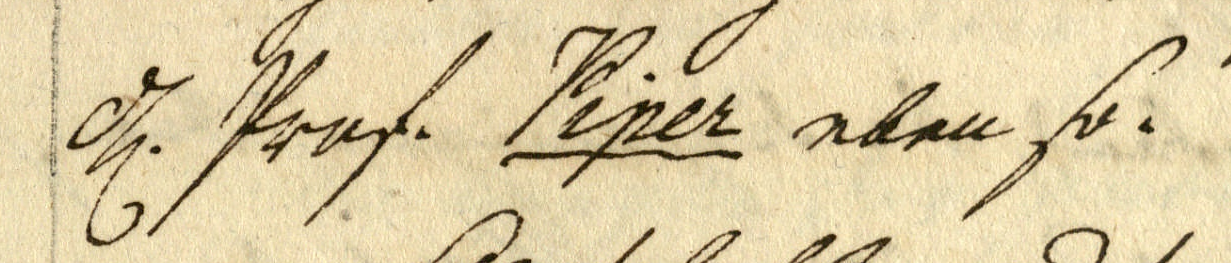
dh. Prof. Piper eben so.
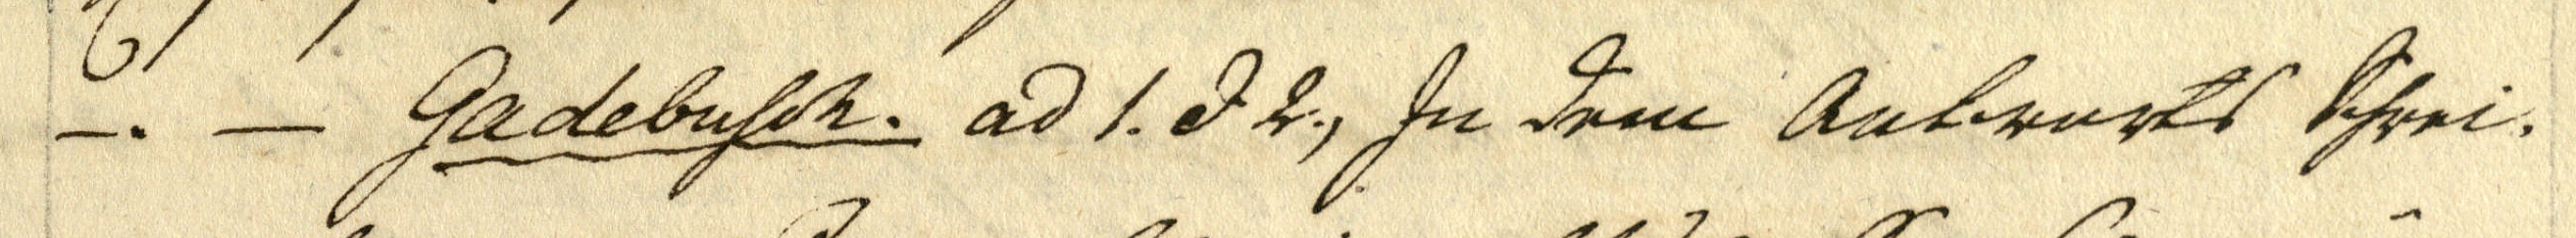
Gadebusch. ad 1. et 2., In dem Antworts Schrei¬
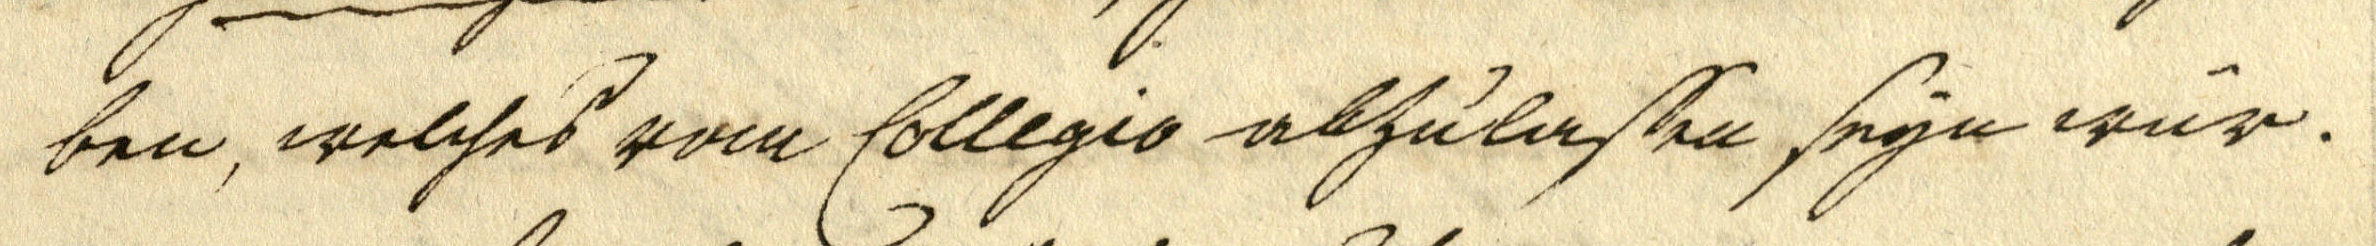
ben, welches vom Collegio abzulassen seÿn wür¬
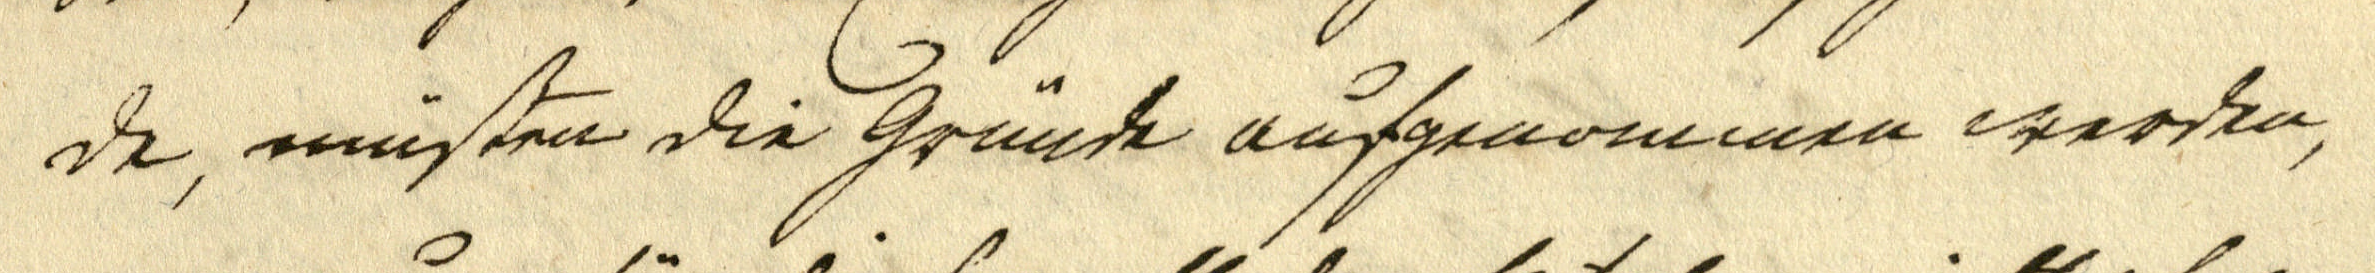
de, müßten die Gründe aufgenommen werden,
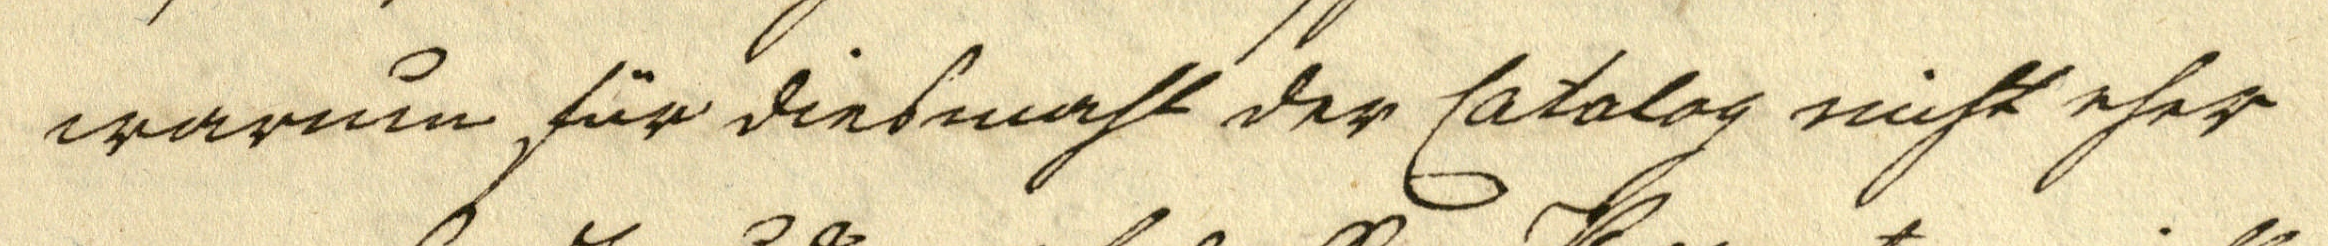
warum für diesmahl der Catalog nicht eher
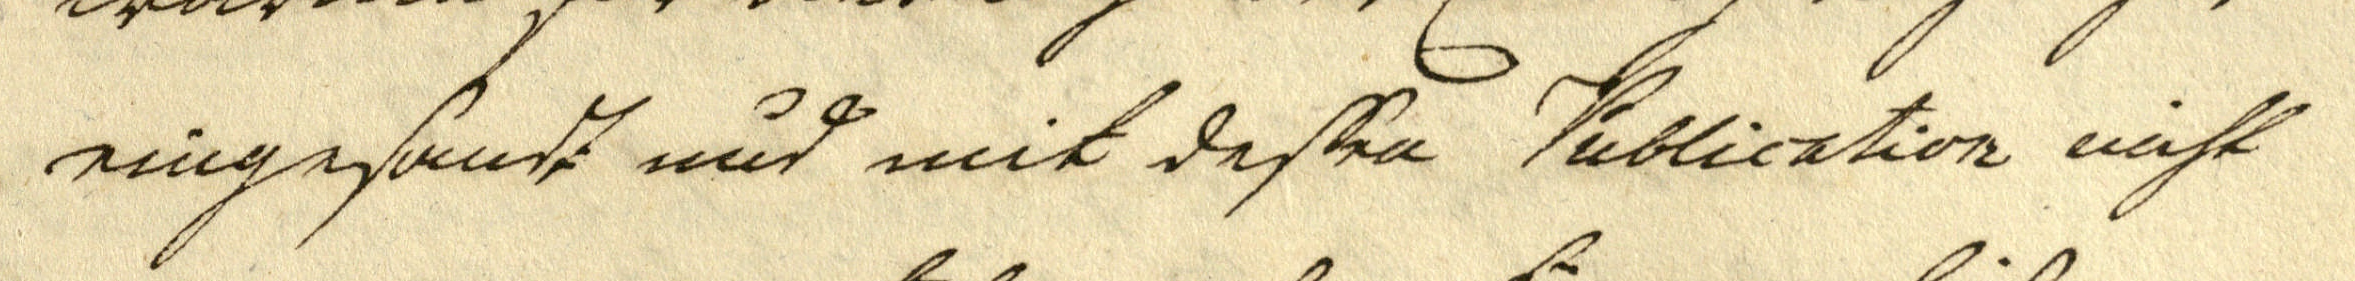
eingesandt und mit dessen Publication nicht
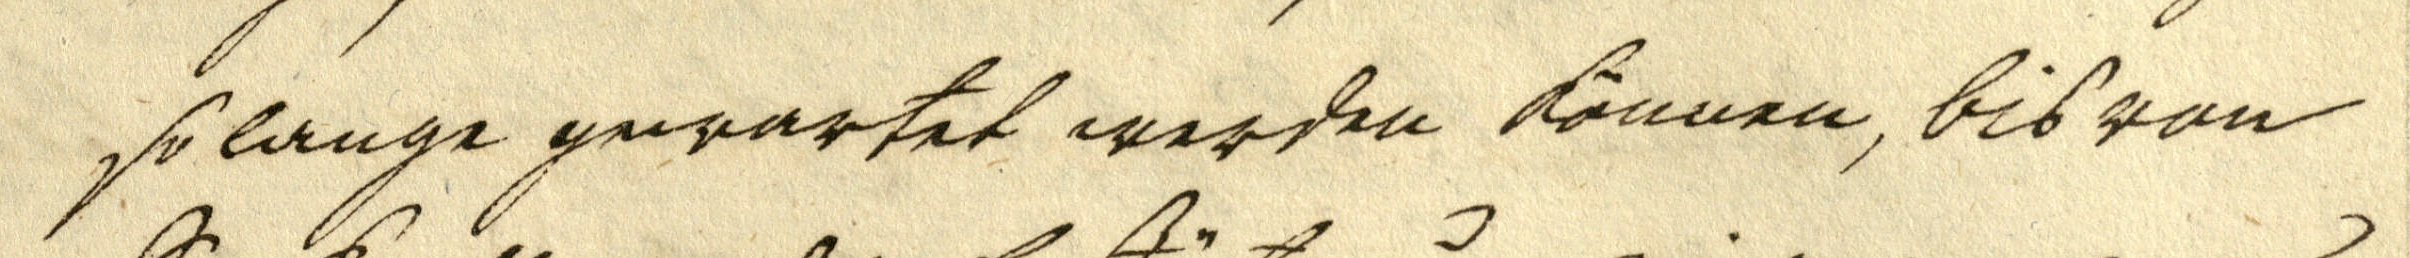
so lange gewartet werden können, bis von
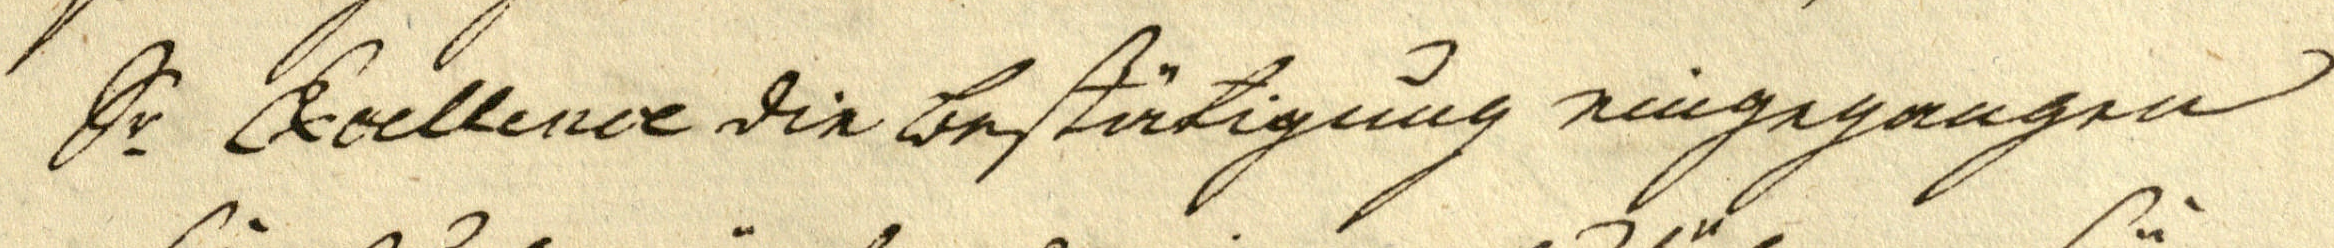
Sr Excellence die Bestätigung eingegangen
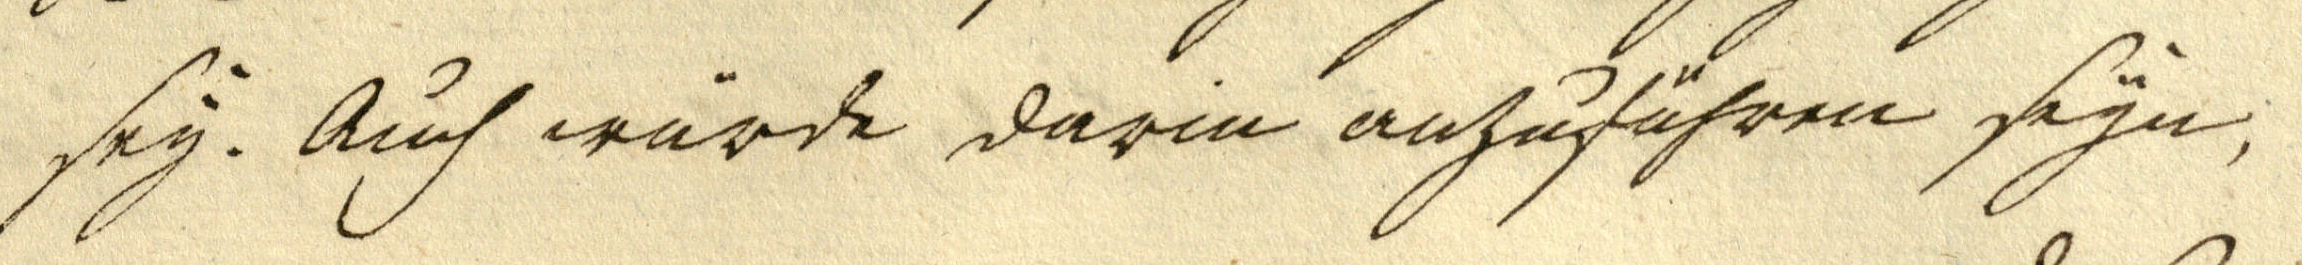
seÿ. Auch würde darin anzuführen seÿn,
